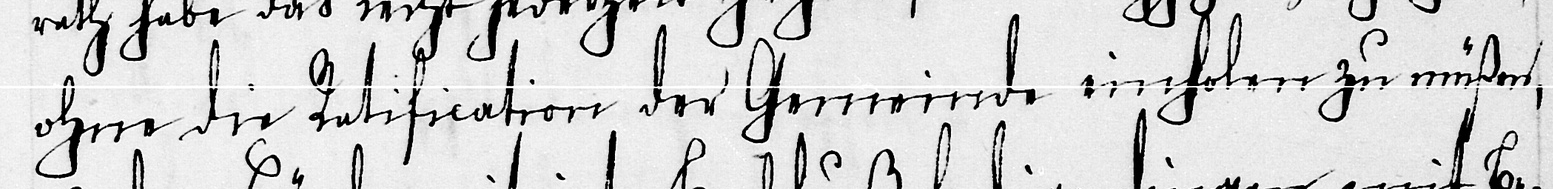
ohne die Ratification der Gemeinde einholen zu müßen,
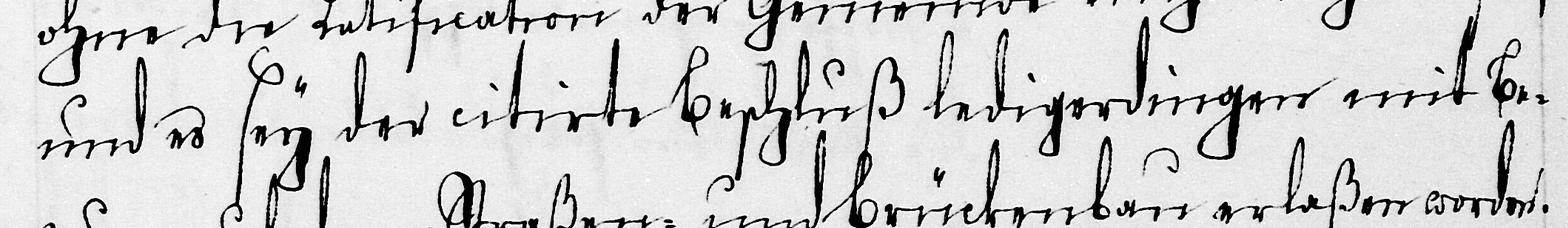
und es sey der citirte Beschluß ledigerdingen mit Be¬
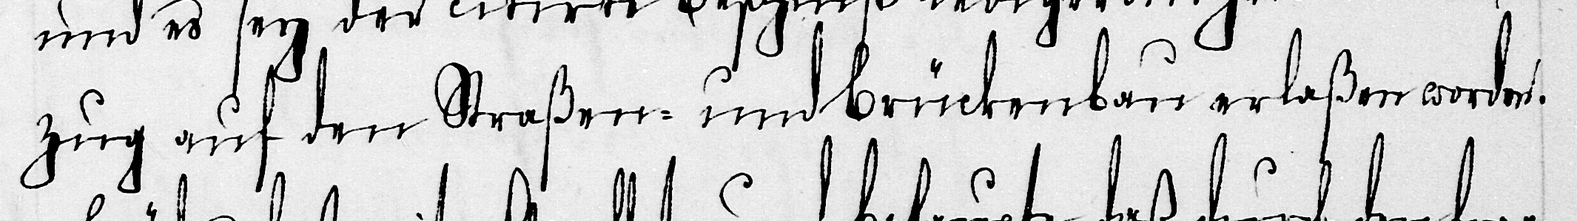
zug auf den Straßen- und Brückenbau erlaßen worden.
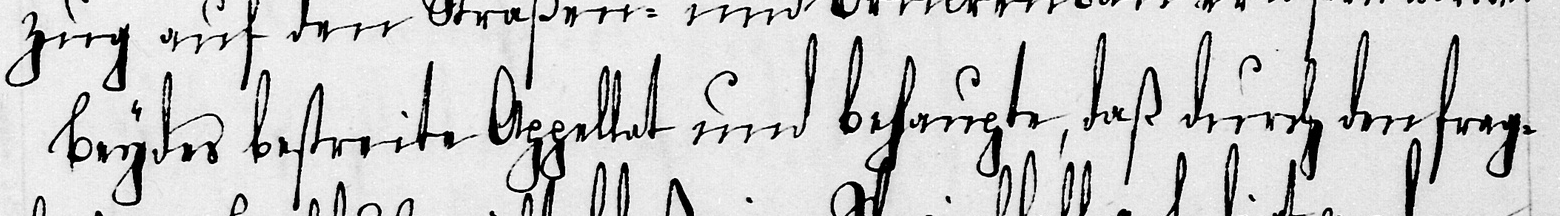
bestreite Appellat und behaupte, daß durch den frag¬
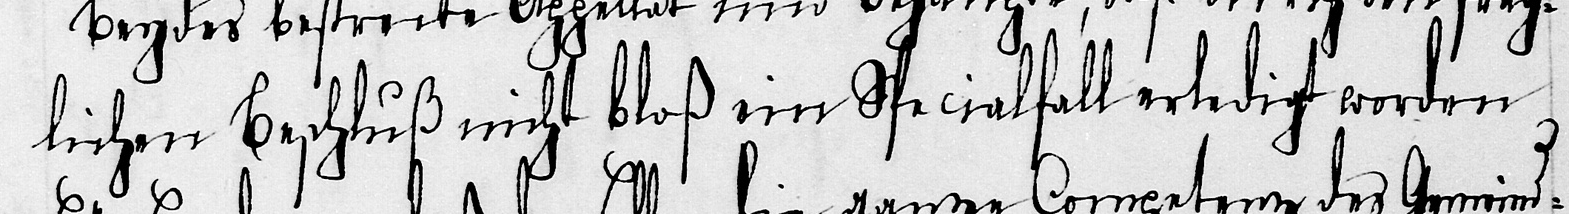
lichen Beschluß nicht bloß ein Specialfall erledigt worden
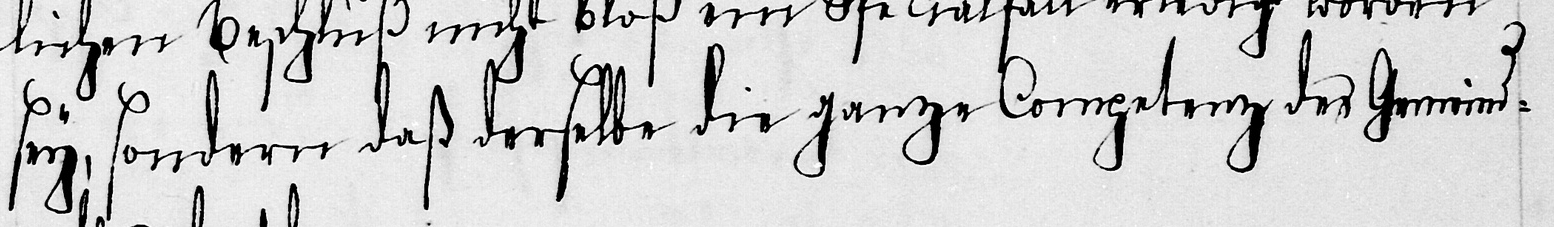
sey, sondern daß derselbe die ganze Competenz des Gemeind¬
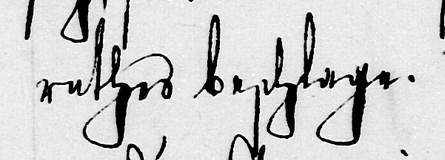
rathes beschlage.
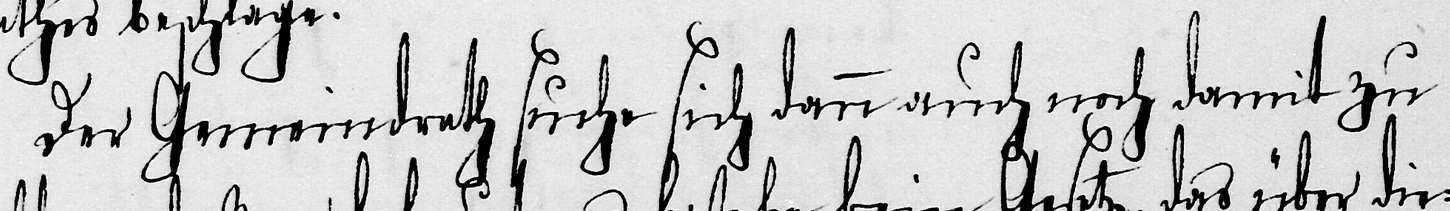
Der Gemeindrath suche sich dann auch noch damit zu
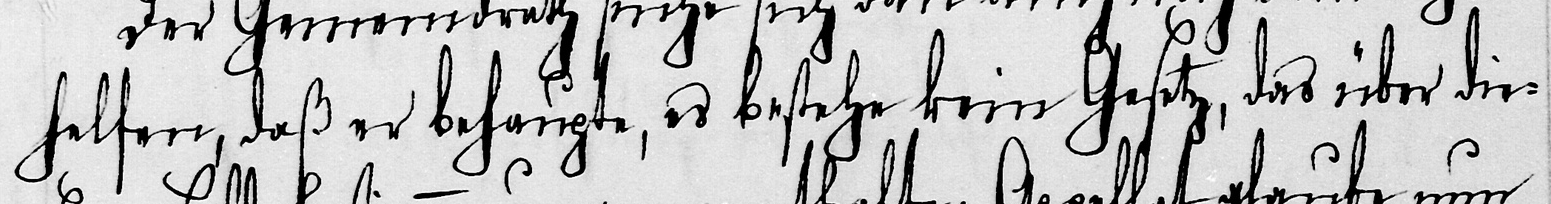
helfen, daß er behaupte, es bestehe kein Gesetz, das über die¬
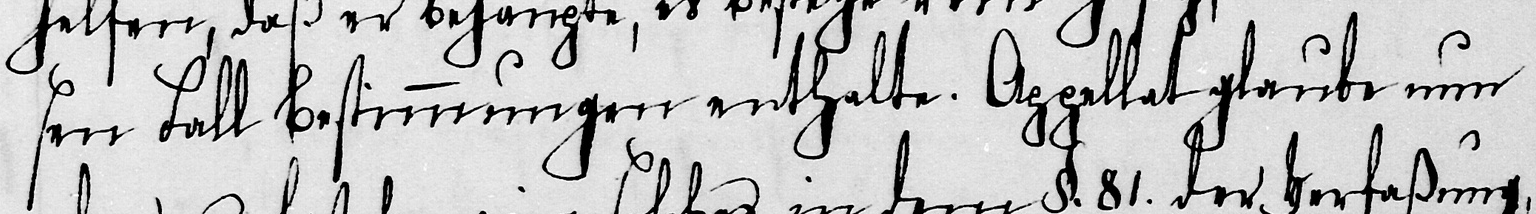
sen Fall Bestimmungen enthalte. Appellat glaube nun
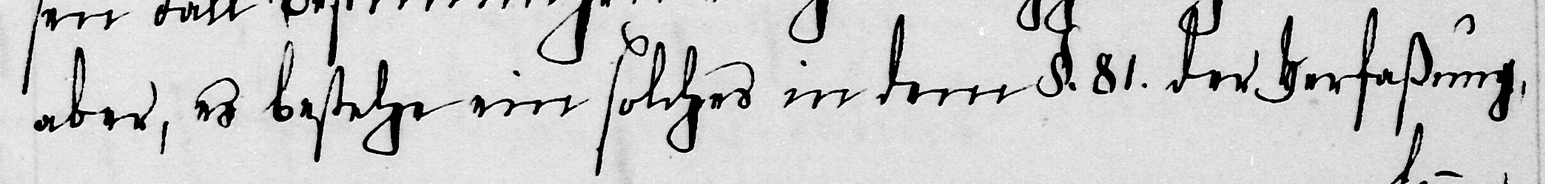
aber, es bestehe ein solches in dem §. 81. der Verfaßung,
